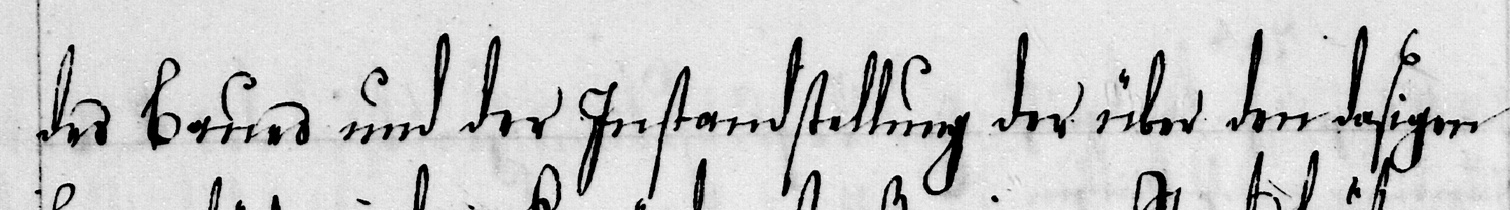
des Baues und der Instandstellung der über den dasigen
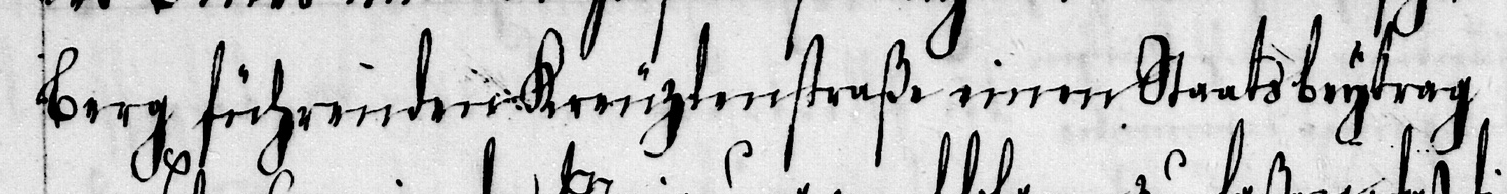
Berg führenden Kreuzlenstraße einen Staatsbeytrag
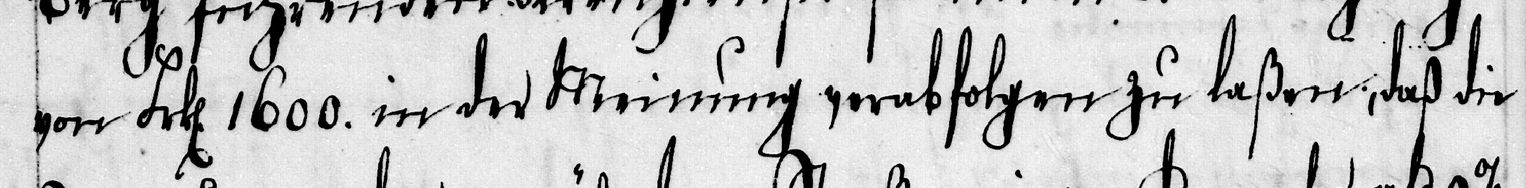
von Frk[en]. 1600. in der Meinung verabfolgen zu laßen, daß die
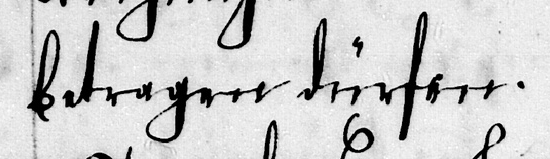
betragen dürfen.
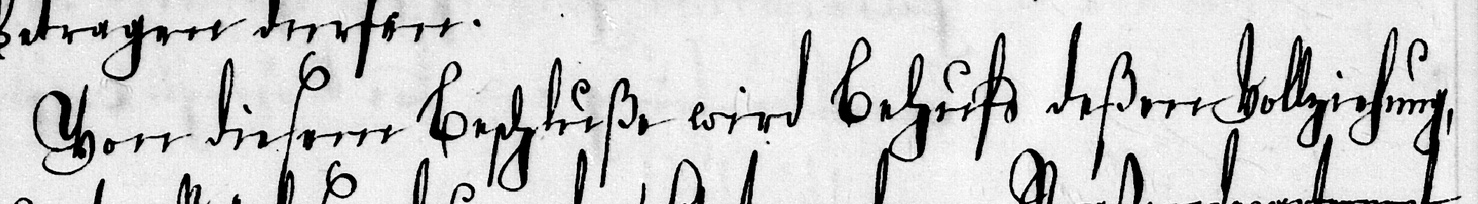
Von diesem Beschluße wird Behufs deßen Vollziehun¬
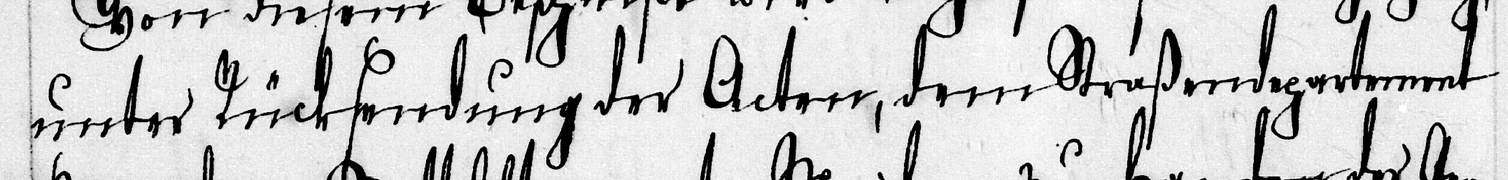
unter Rücksendung der Acten, dem Straßendepartement
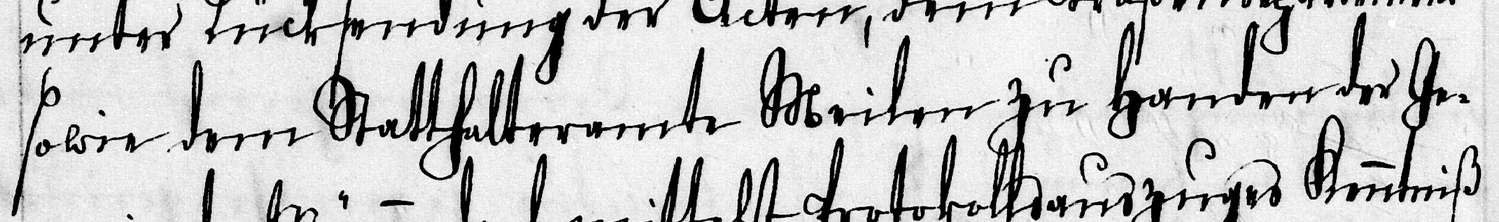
sowie dem Statthalteramte Meilen zu Handen der Ge¬
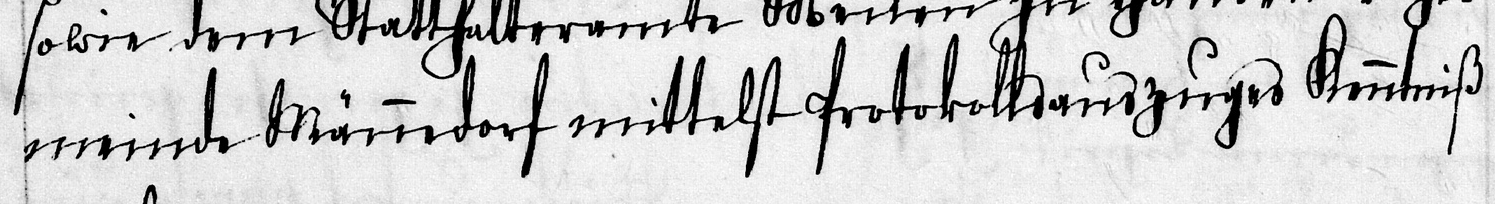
meinde Männedorf mittelst Protokollsauszuges Kenntniß
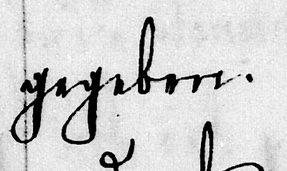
gegeben.
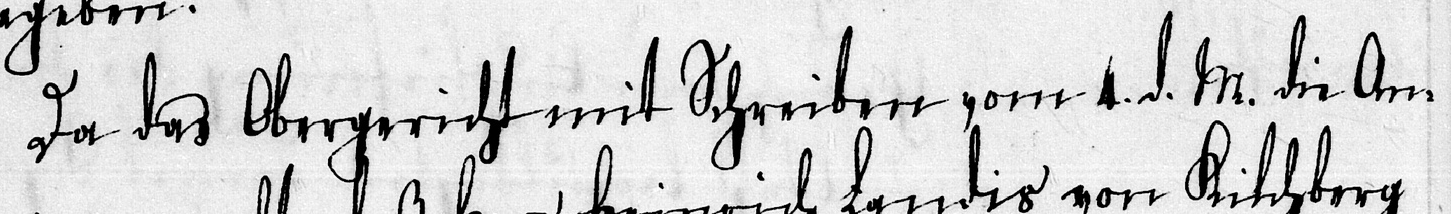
Da das Obergericht mit Schreiben vom 4. d. M. die An¬
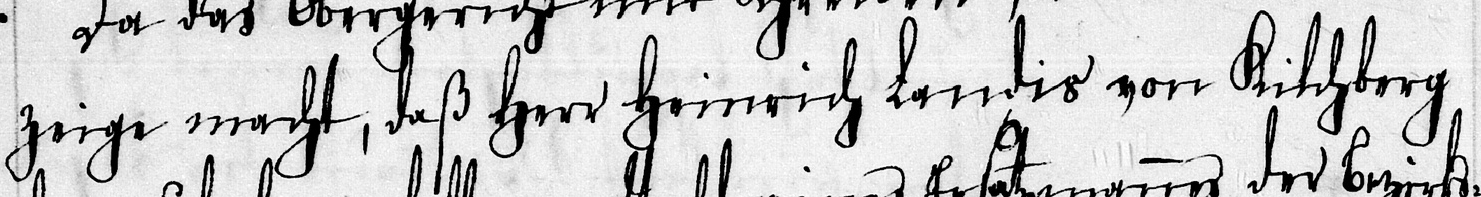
zeige macht, daß Herr Heinrich Landis von Kilchberg
